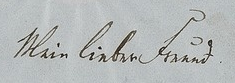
Mein lieber Freund.
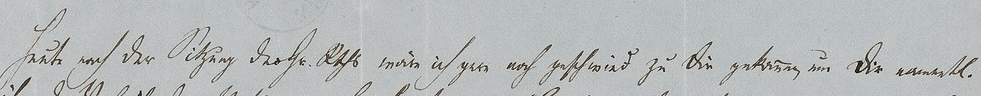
Heute nach der Sitzung des Gr. Rths wäre ich gern noch geschwind zu Dir gekommen, um Dir namentl.
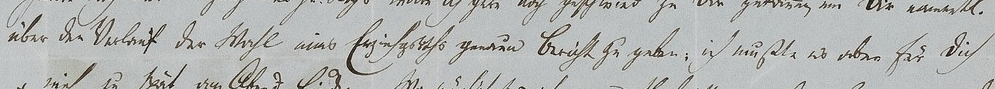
über den Verlauf der Wahl eines Erziehgrths genauen Bericht zu geben; ich mußte es aber für Dich
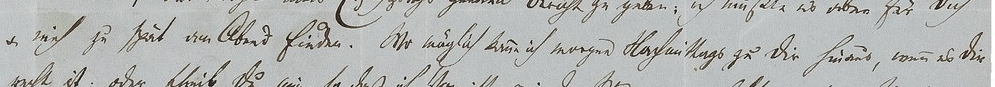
& mich zu spät am Abend finden. Wo möglich komme ich morgen Nachmittags zu Dir hinaus, wenn es Dir
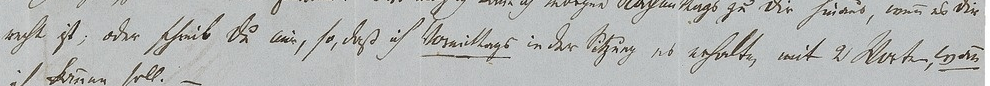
recht ist; oder schreib Du mir, so, daß ich Vormittags in der Sitzung es erhalte, mit 2 Worten, wann
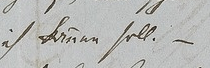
ich kommen soll. –
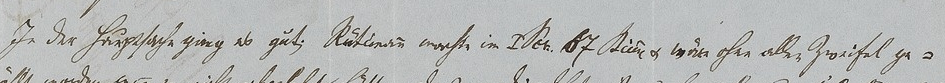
In der Hauptsache ging es gut; Rütimann machte im l. Scr. 67 Stimmen & wäre ohne allen Zweifel ge-
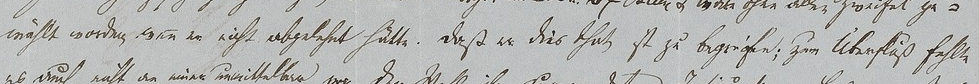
wählt worden, wenn er nicht abgelehnt hätte. Daß er dies that, ist zu begreifen; zum Überfluß fehlte
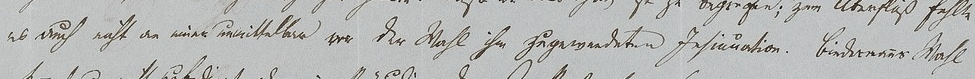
es auch nicht an einer unmittelbar vor der Wahl ihm zugewendeten Insinuation. Biedermanns Wahl
